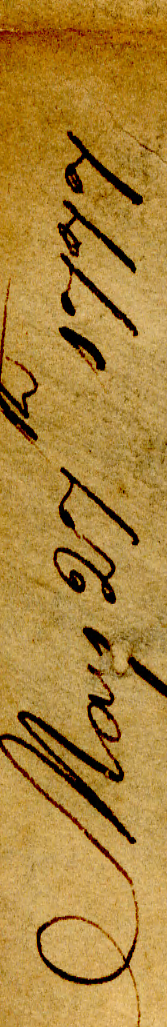May 27^th 1777
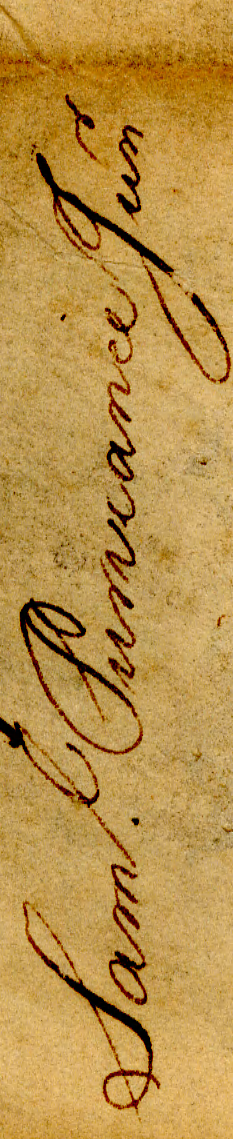Sam^l. Purviance Jun^r
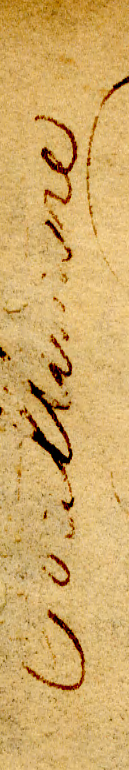Baltimore
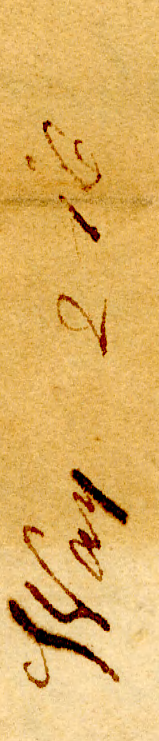Way 2 16
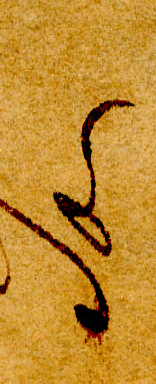To
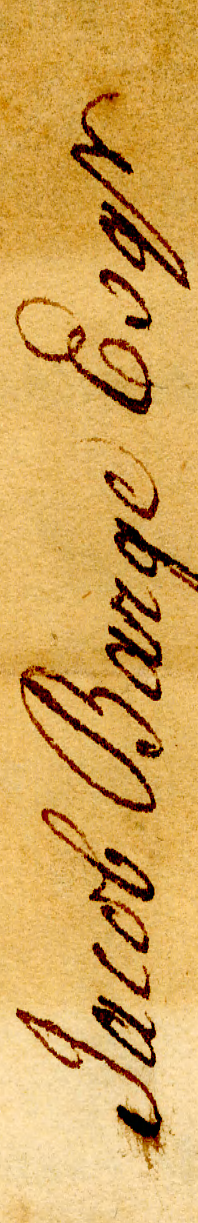Jacob Barge Esq^r
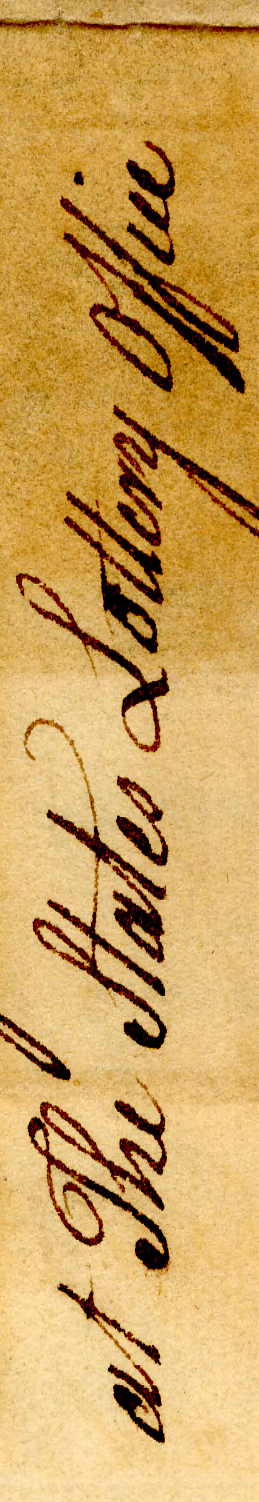at The States Lottery Office
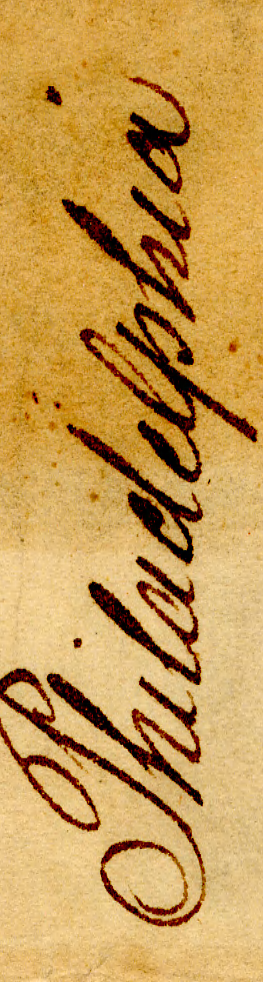Philadelphia
